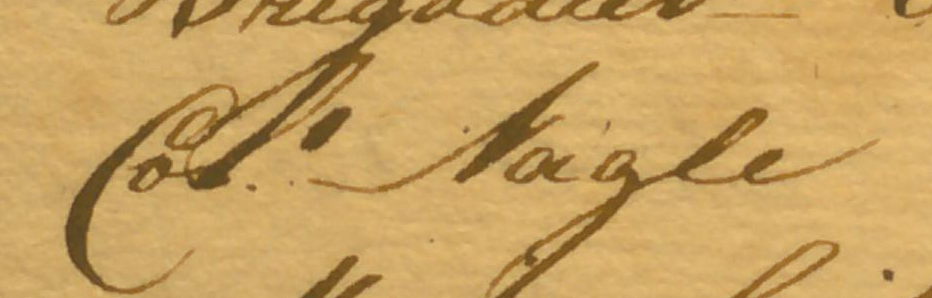Col^o. Nagle
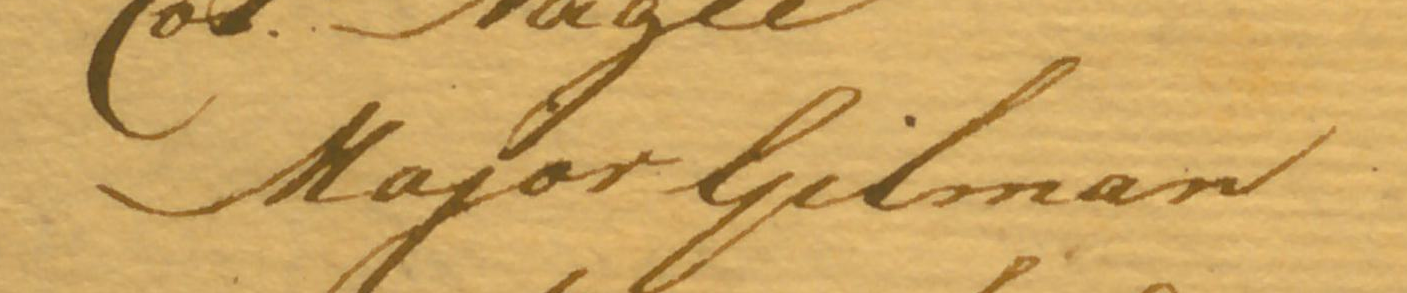Major Gilman
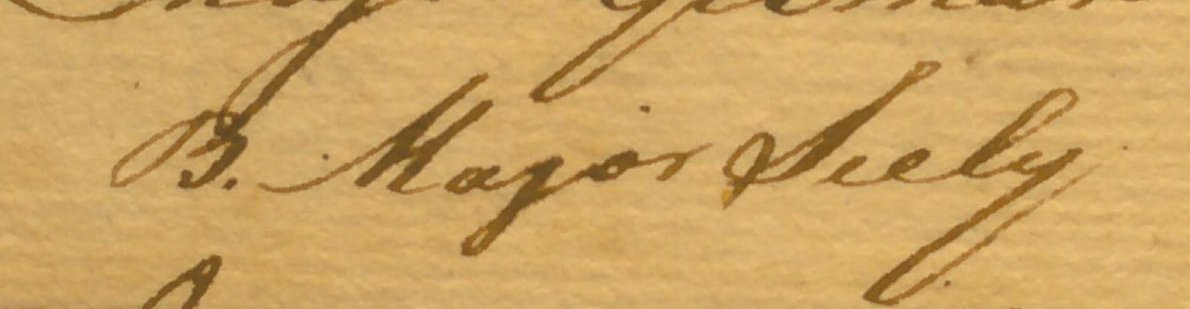B. Major Seely
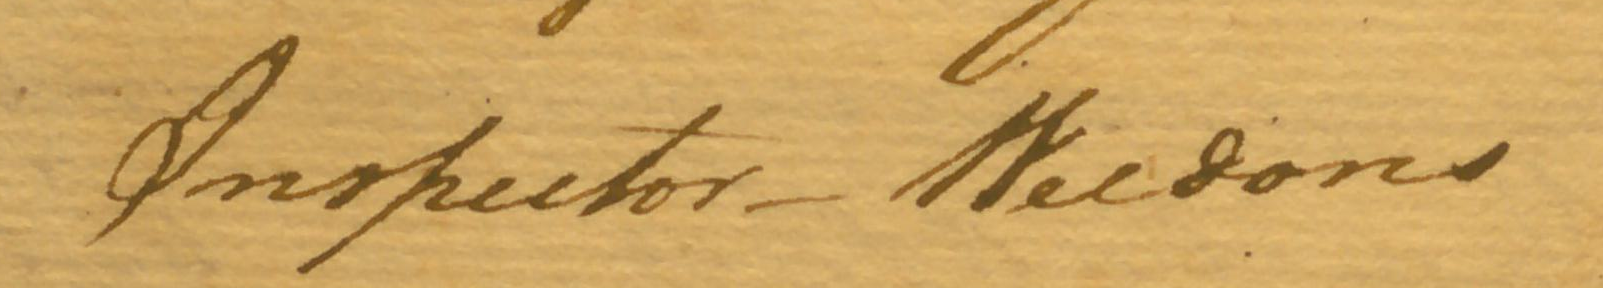Inspector- Weedons
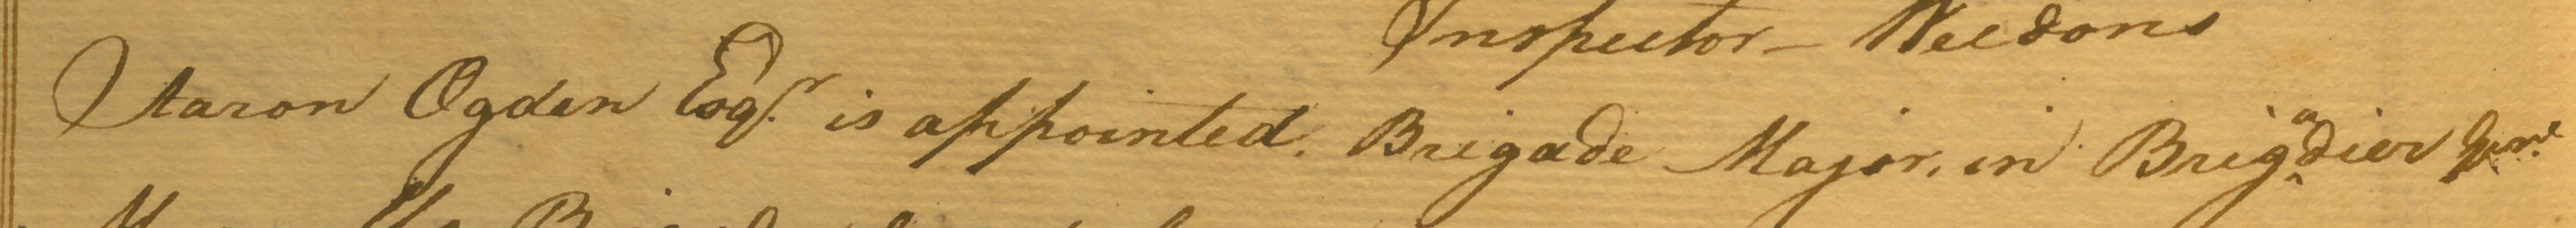Aaron Ogden Esq^r. is appointed Brigade Major in Brig^adier Gen^l
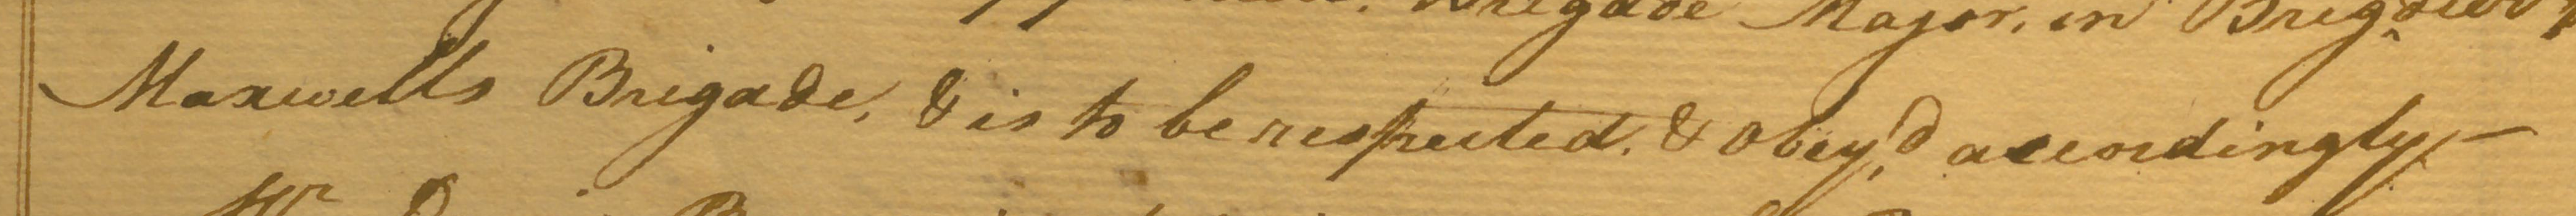Maxwells Brigade, & is to be respected & obey'd accordingly-
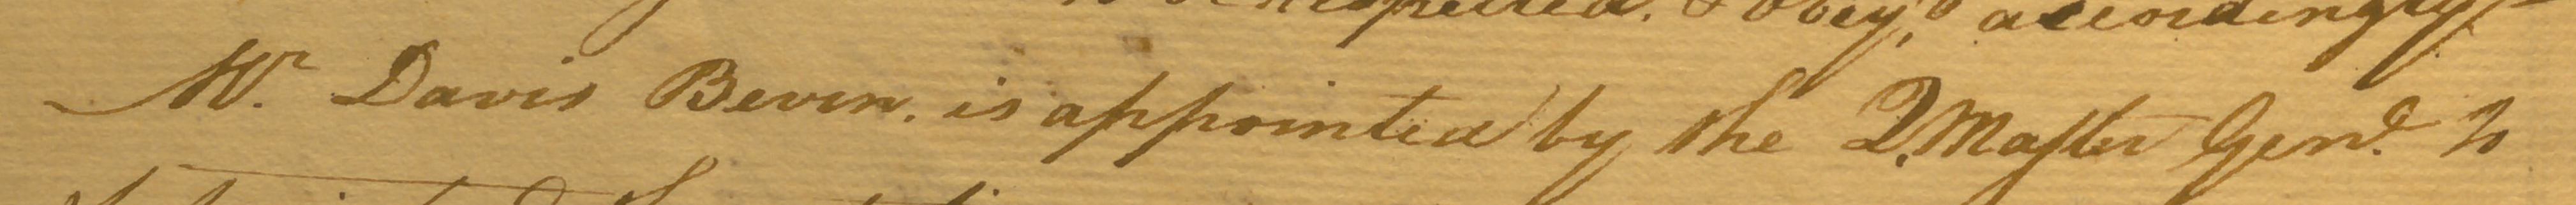M^r. Davis Bevin is appointed by the Q. Master Gen^l. to
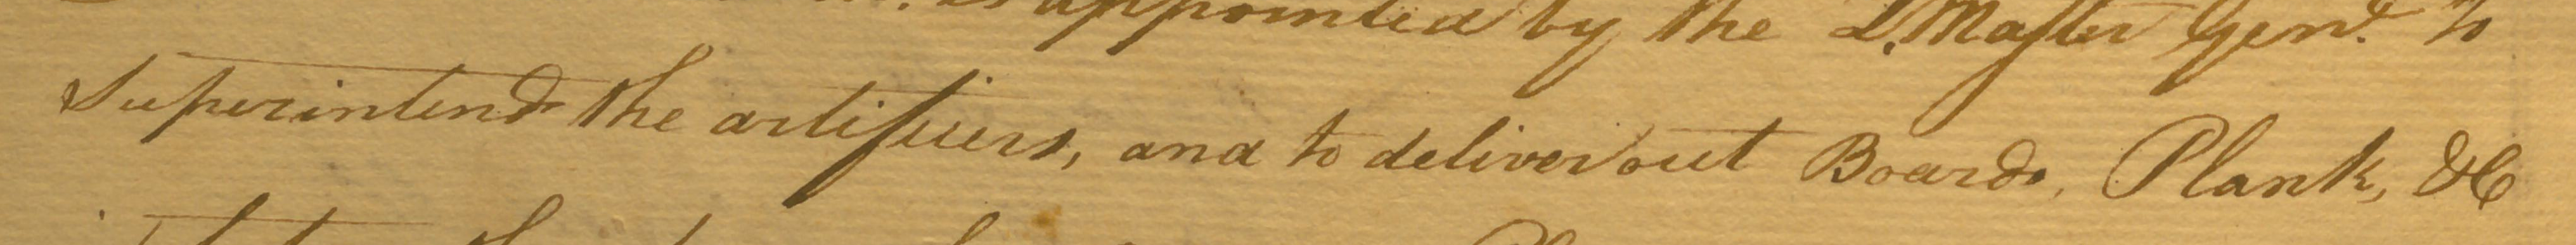Superintend the artificers, and to deliver acct Boards, Plank, &c
